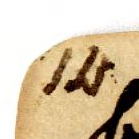14
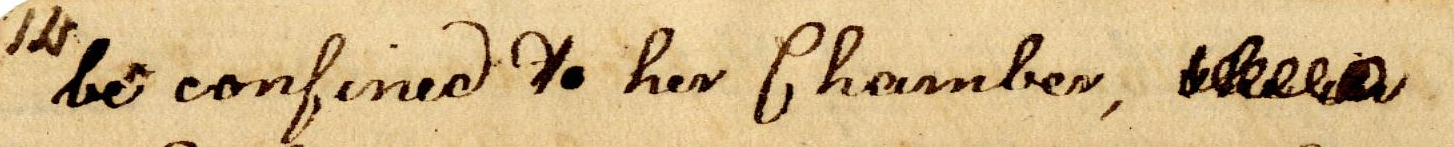be confined to her Chamber, [_____]
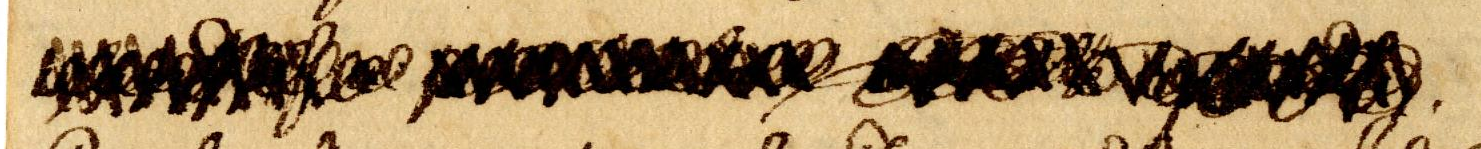[____________________________]
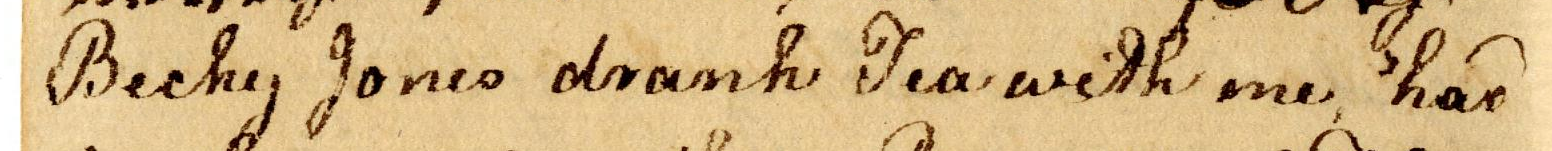Becky Jones drank Tea with me, had
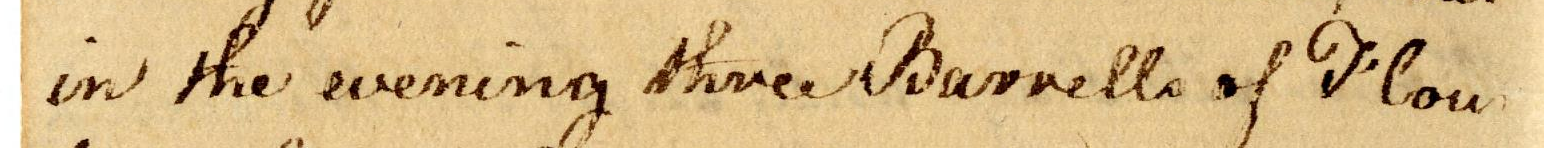in the evening three Barrells of Flour
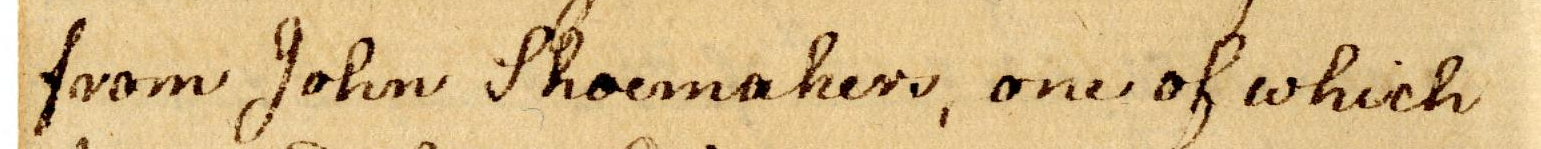from John Shoemakers, one of which
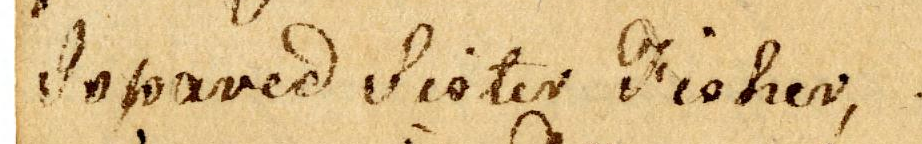I spared Sister Fisher,
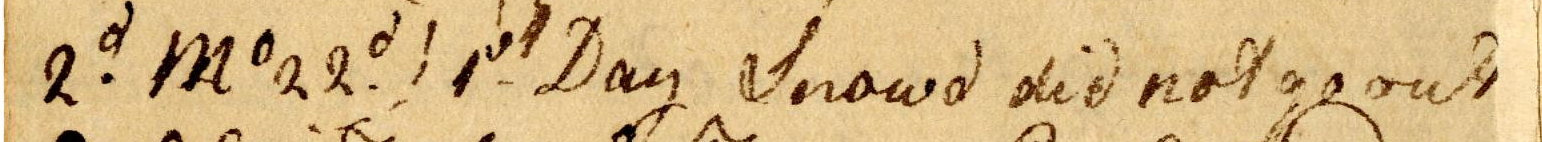2^d M^o 22^d ) 1^st Day Snowd did not of out
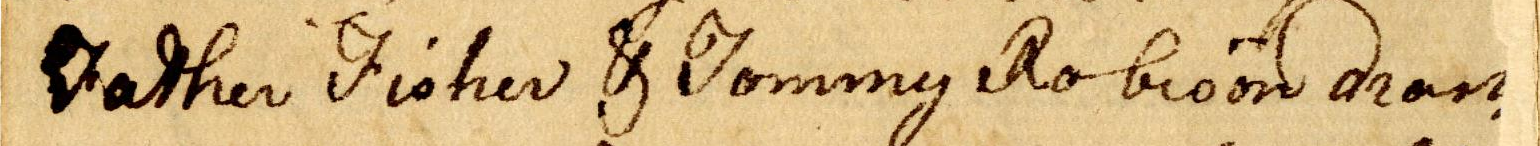Father Fisher & Tommy Robison dran
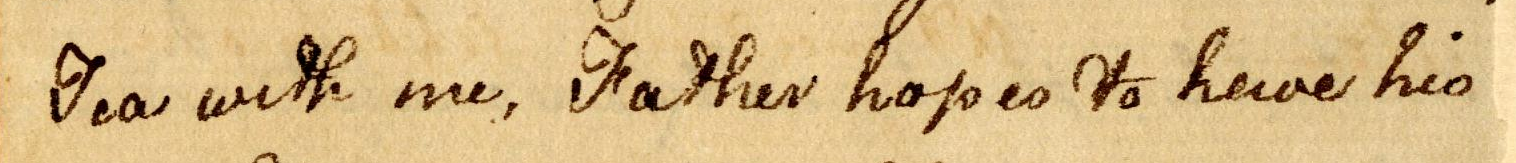Tea with me, Father hopes to have his
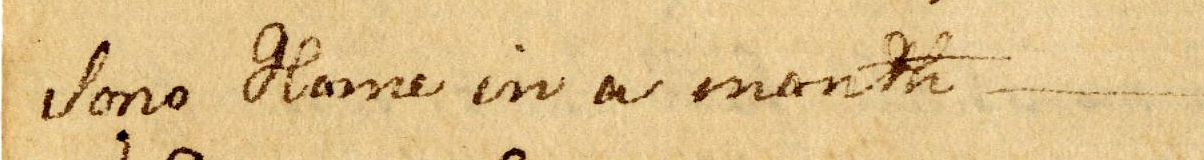Sons Home in a month-
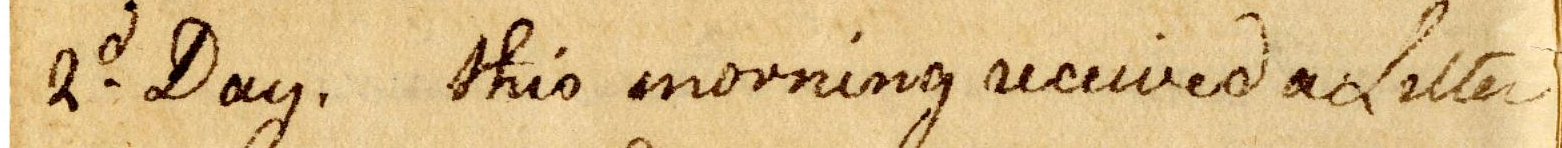2^d. Day. this morning received a Letter
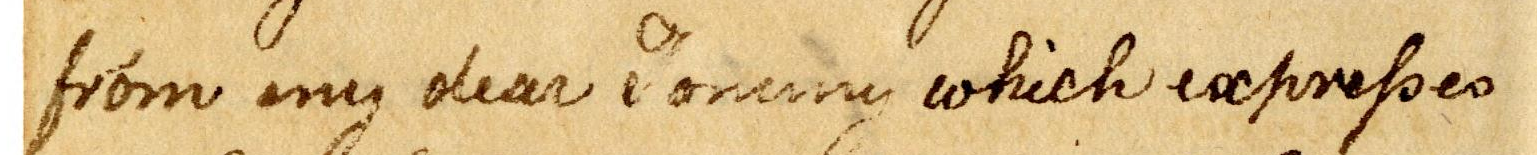from my dear Tommy which expresses
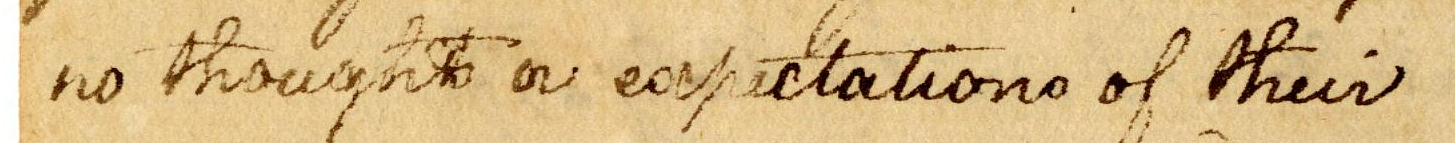no thoughts or expectations of their
